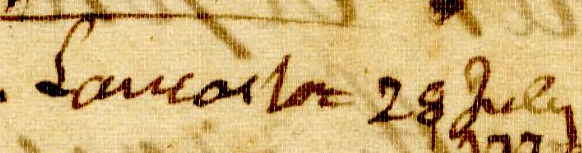Lancaster 28 July
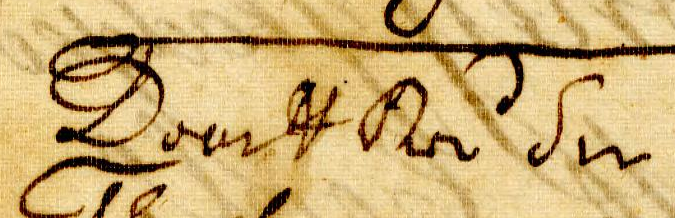Dear & Rev^d Sir
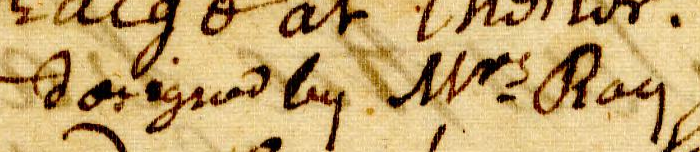designed by M^rs. Ray
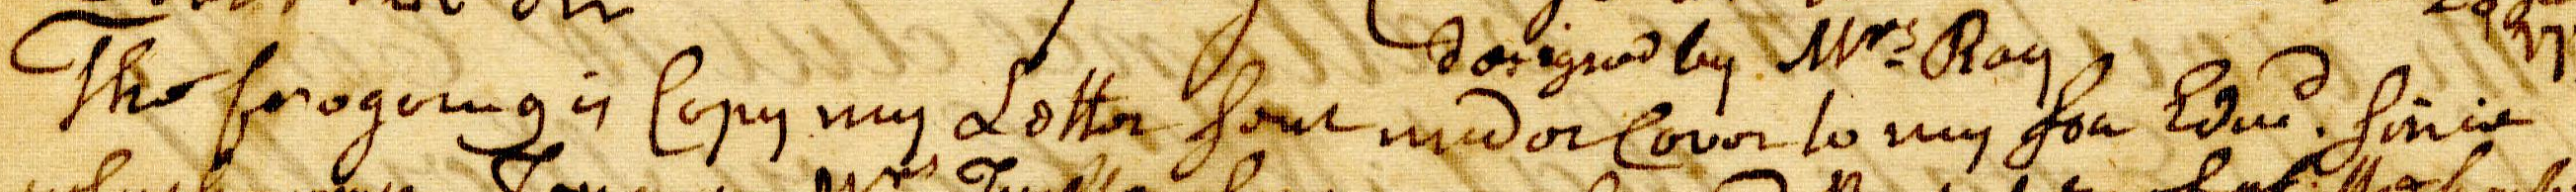the foregoing is Copy my Letter sent under Cover to my Son Erw^d. Since
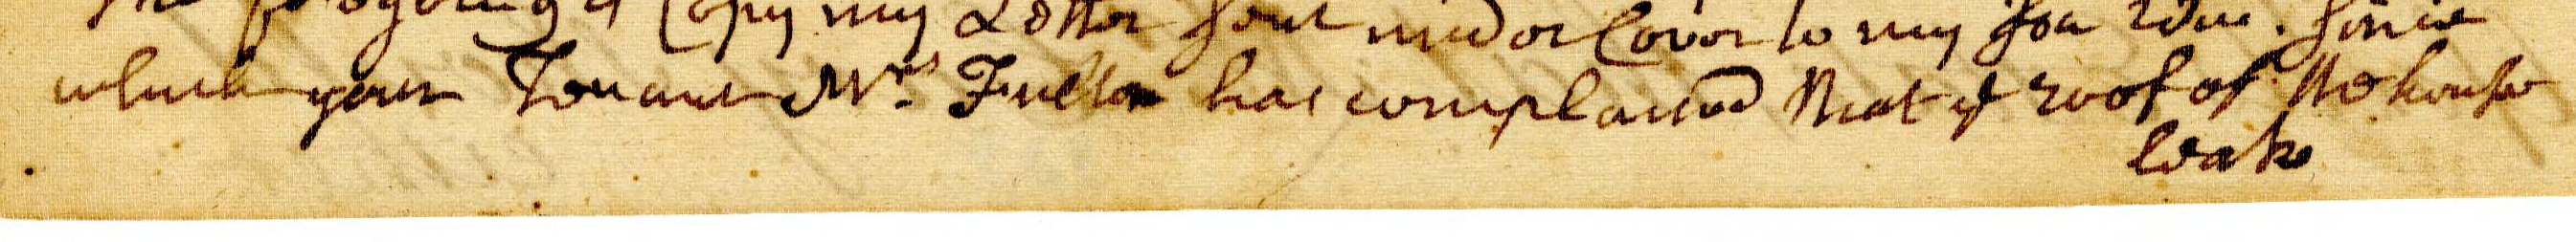which your Tenant M^rs. Feullon has complained that y^e roof of the house
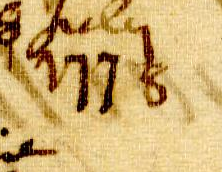1778
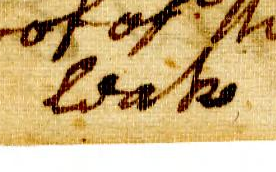leaks
